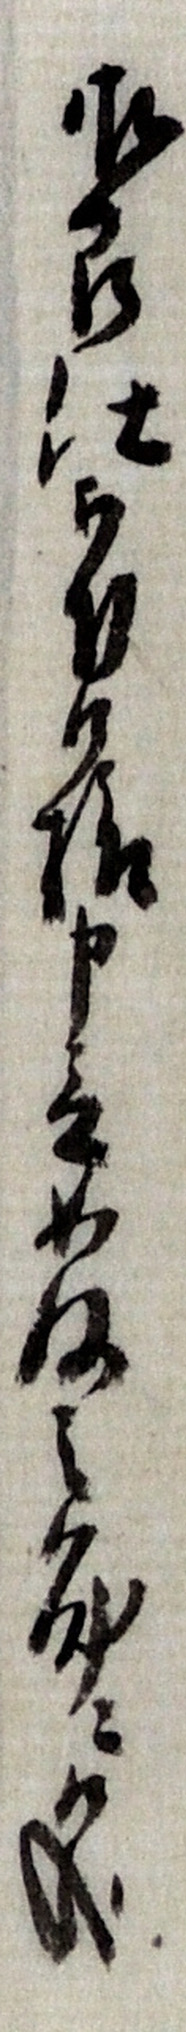御召仕被下候様申立如何之筋ニ候哉
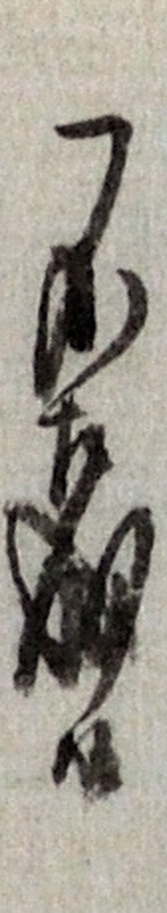不相成候
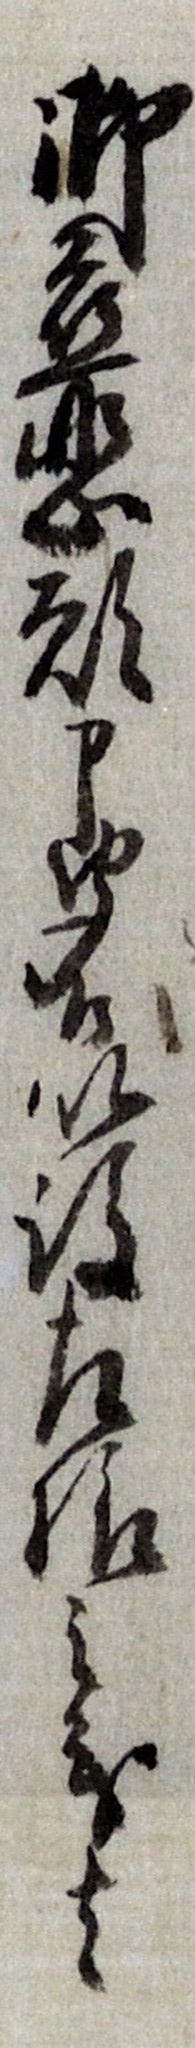御慈悲願申聞候以後左様之義者
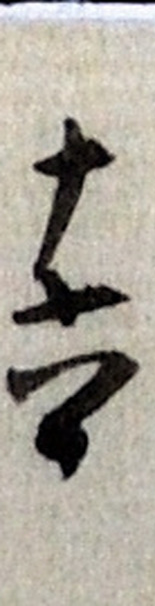十六日
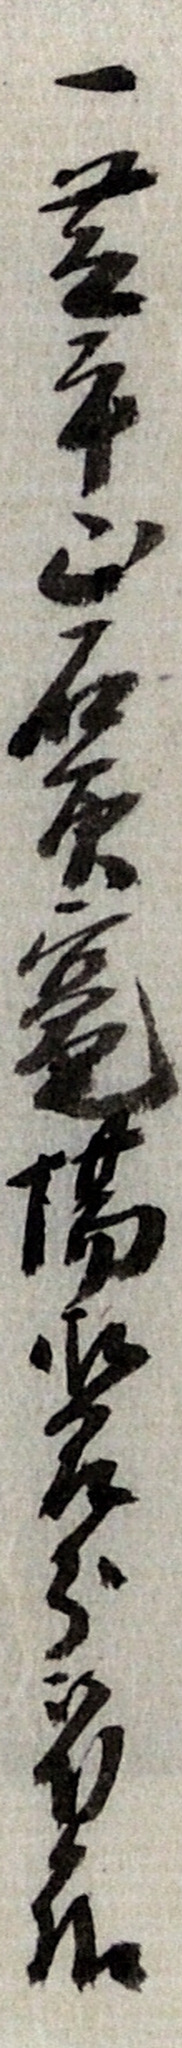一芝平山石灰竃場御見分被下候様
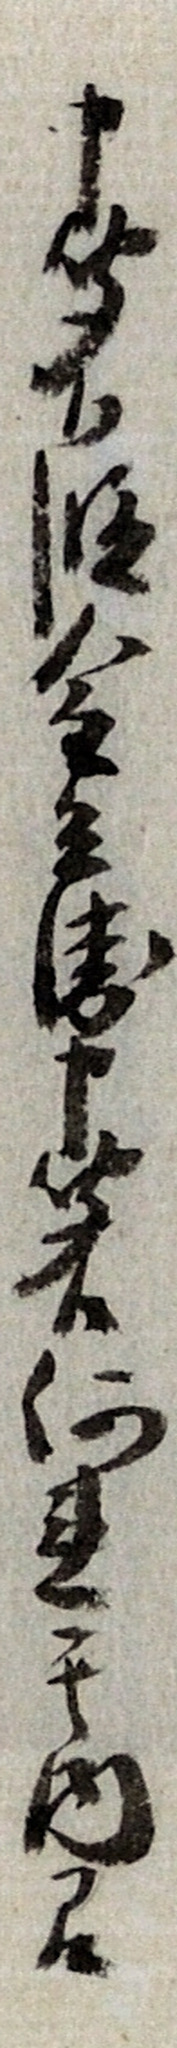申聞候段金兵衛申聞候何れ其内見
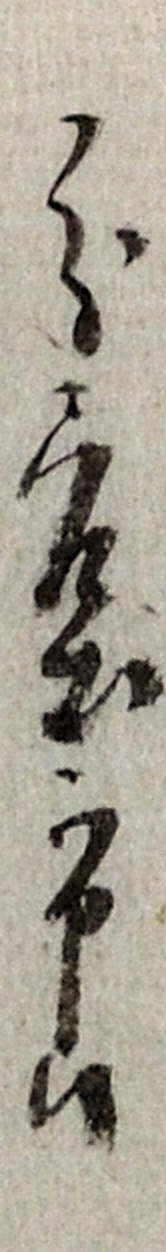分差出可申候
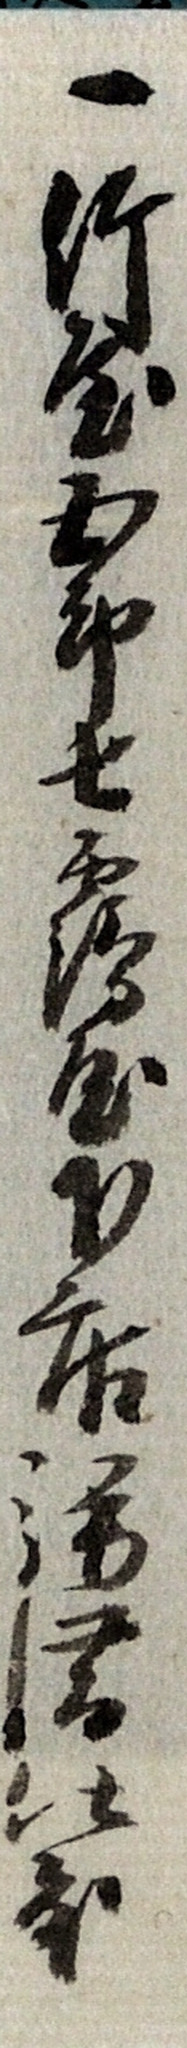一竹屋五郎七鶴屋下店拝借仕度
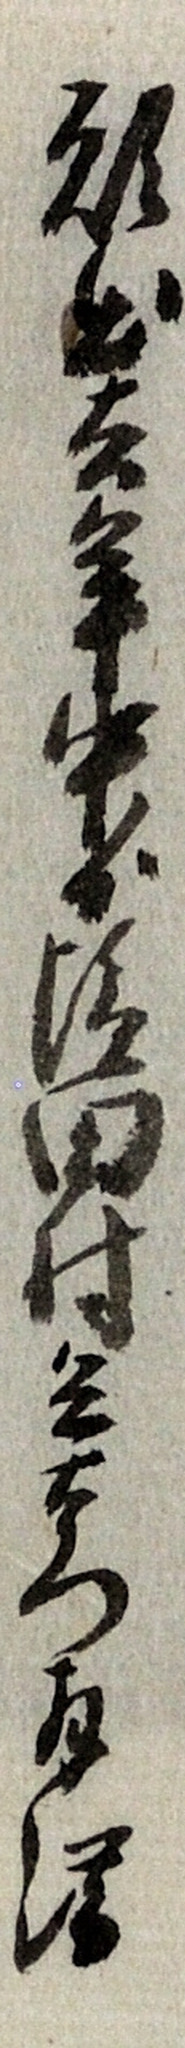願出去年中ゟ塩田村兵右衛門拝借
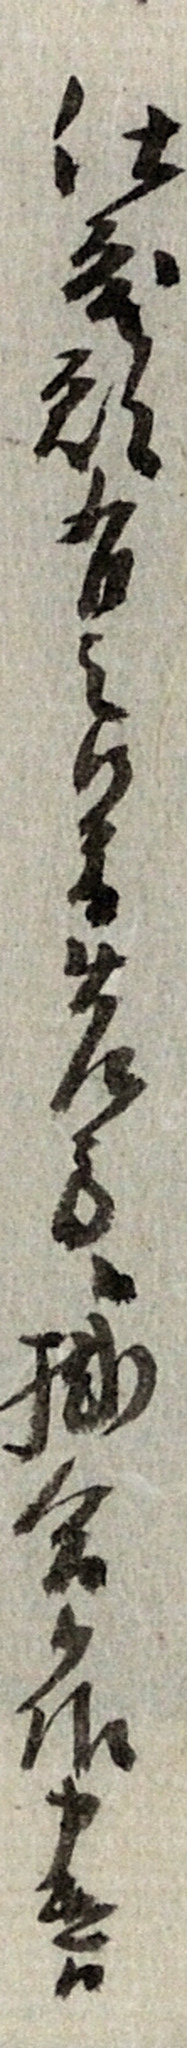仕義願有之候間先方江掛合候様申遣候
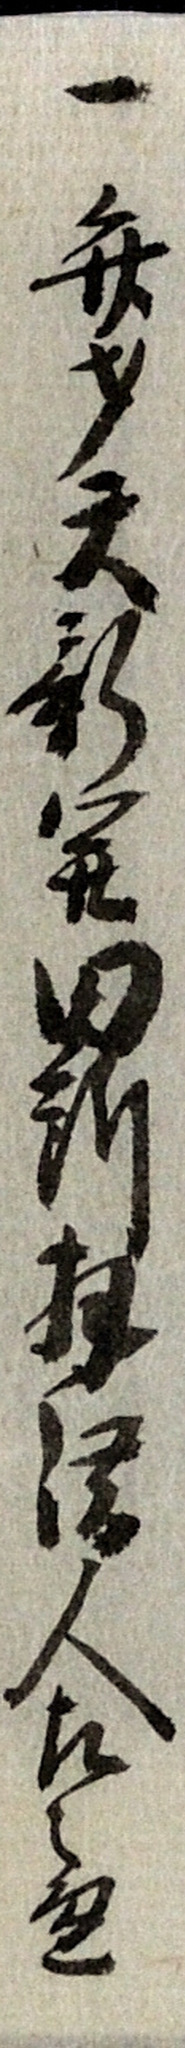一弁才天新開田所拝借人左之通
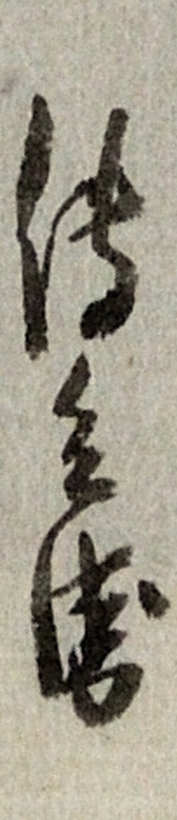伝兵衛
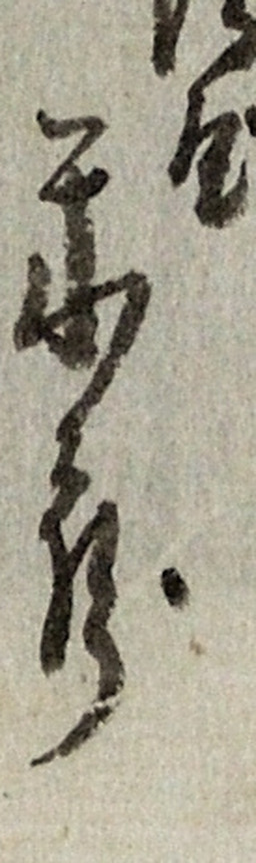伝兵衛
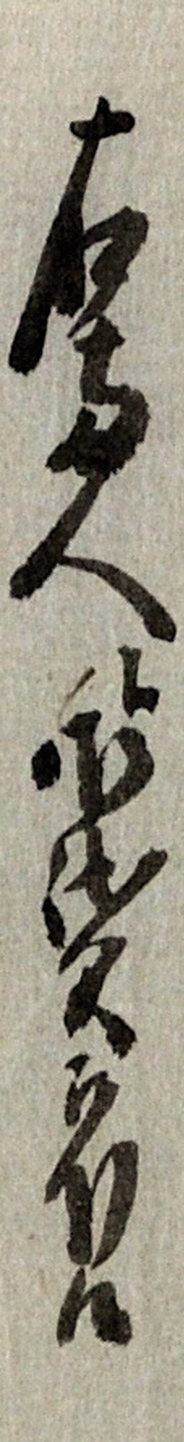右両人江御貸被下候
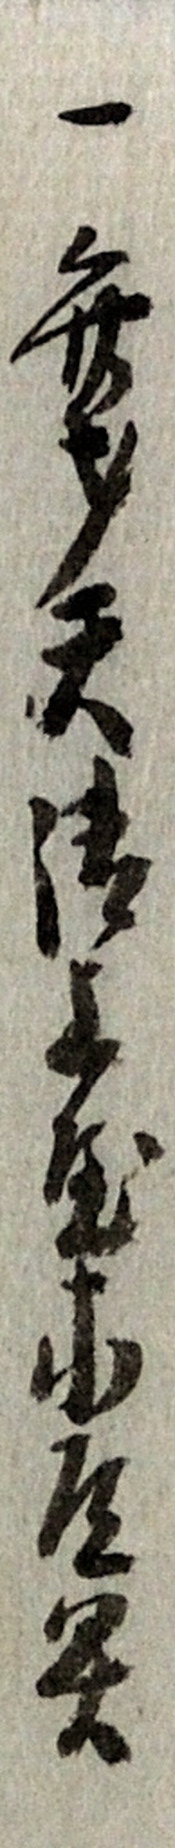一弁才天御上屋木道具
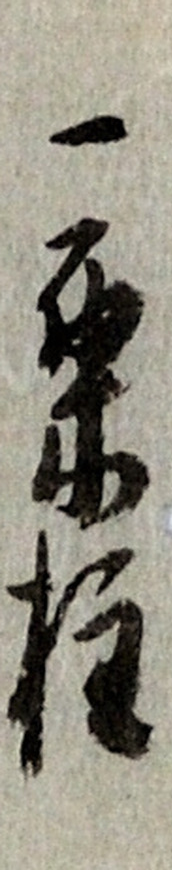一栗柱
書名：諸事御用留
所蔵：伊那市立高遠町図書館・合同会社AMANE
